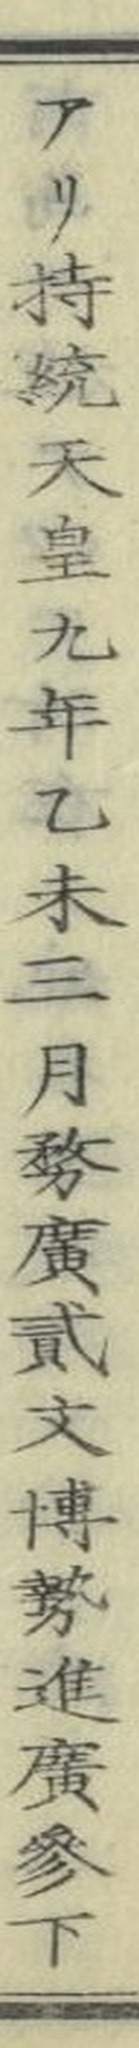アリ持統天皇九年乙未三月務廣貳文博勢進廣參下
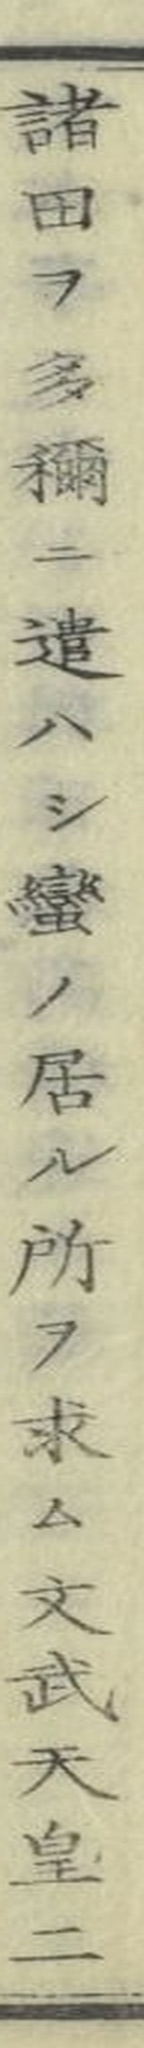諸田ヲ多禰ニ遣ハシ蠻ノ居ル所ヲ求ム文武天皇二
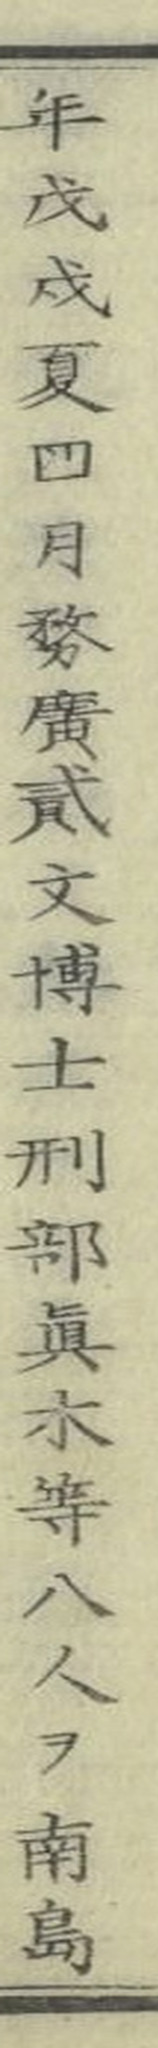年戊戌夏四月務廣貳文博士刑部眞木等八人ヲ南島
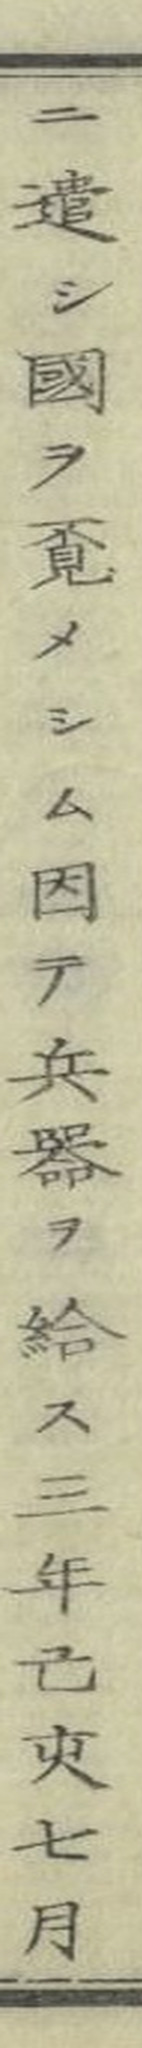ニ遣シ國ヲ覔メシム因テ兵器ヲ給ス三年己亥七月
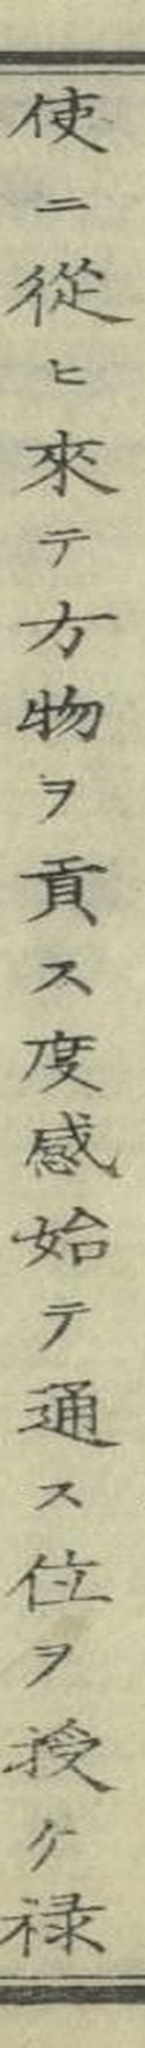使ニ從ヒ來テ方物ヲ貢ス度感始テ通ス位ヲ授ケ禄
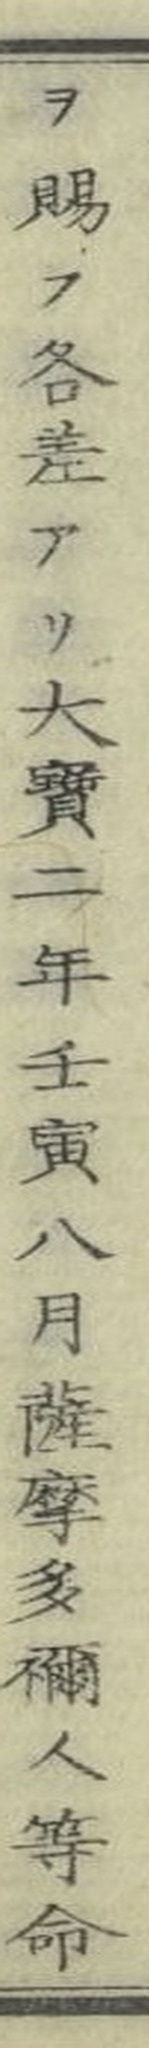ヲ賜フ各差アリ大寶二年壬寅八月薩摩多禰人等命
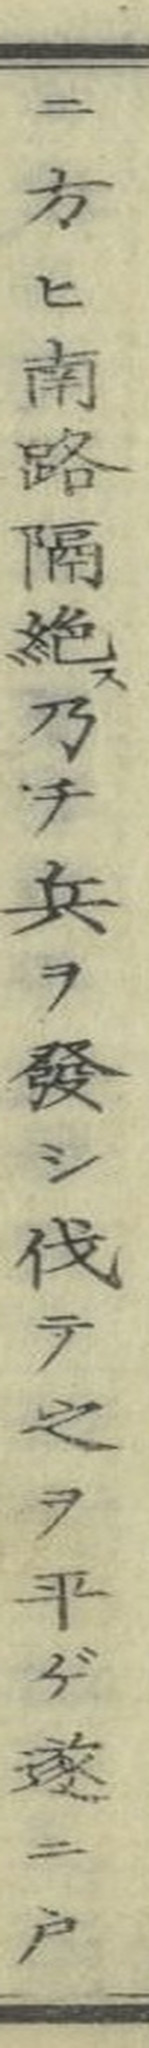ニ方ヒ南路隔絶乃チ兵ヲ發シ伐テ之ヲ平ゲ遂ニ戸

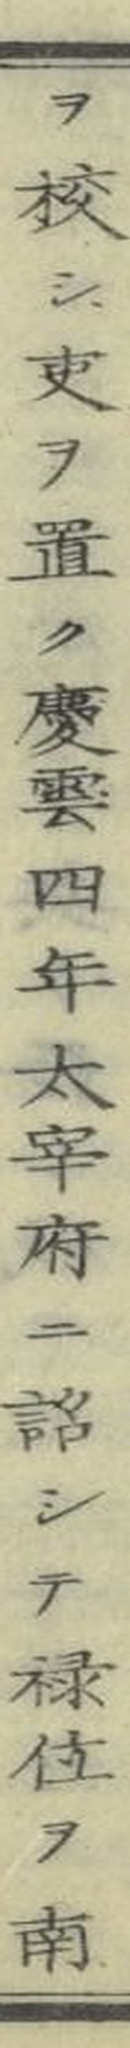ヲ校シ吏ヲ置ク慶雲四年太宰府ニ詔シテ禄位ヲ南
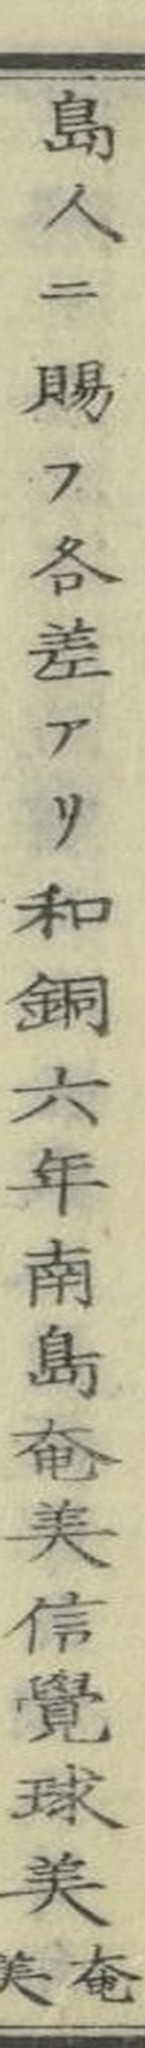島人ニ賜フ各差アリ和銅六年南島奄美信覺球美奄美
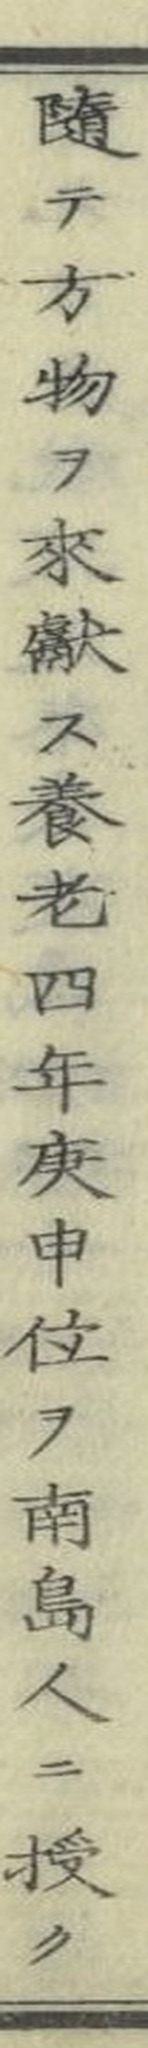随テ方物ヲ來獻ス養老四年庚申位ヲ南島人ニ授ク
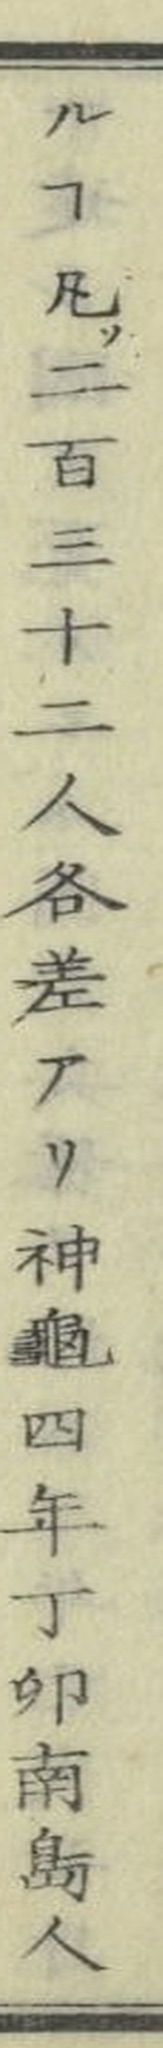ルコト凡二百三十二人各差アリ神龜四年丁卯南島人
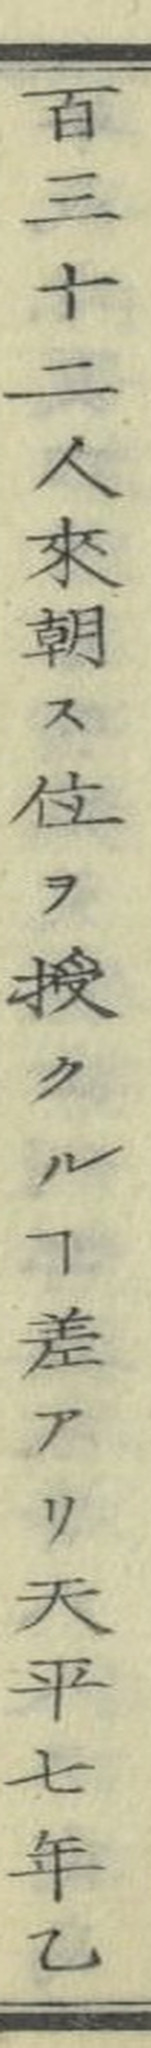百三十二人來朝ス位ヲ授クルコト差アリ天平七年乙
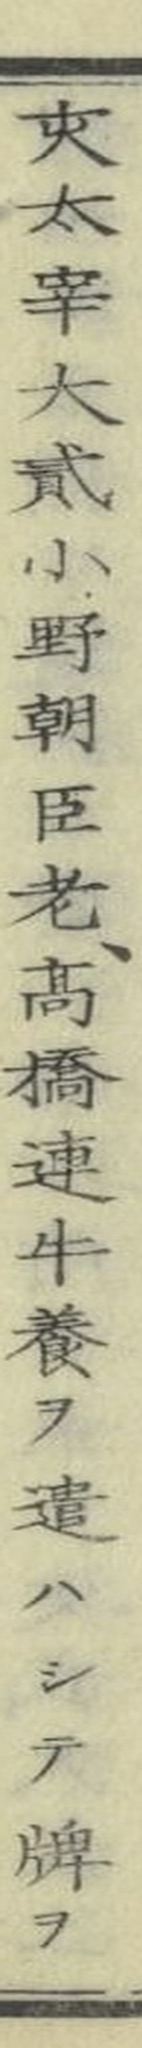亥太宰大貳小野朝臣老、高橋連牛養ヲ遣ハシテ牌ヲ
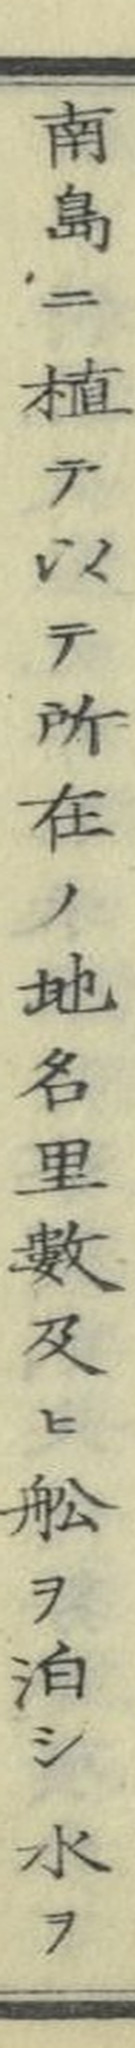南島ニ植テ以テ所在ノ地名里數及ヒ舩ヲ泊シ水ヲ
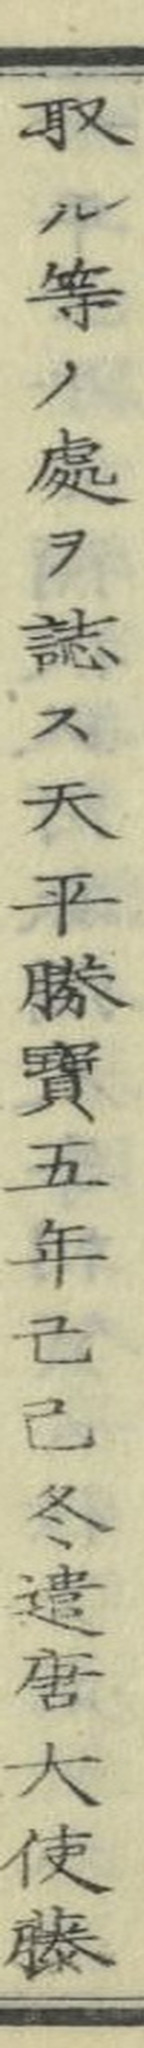取ル等ノ處ヲ誌ス天平勝寶五年癸巳冬遣唐大使藤
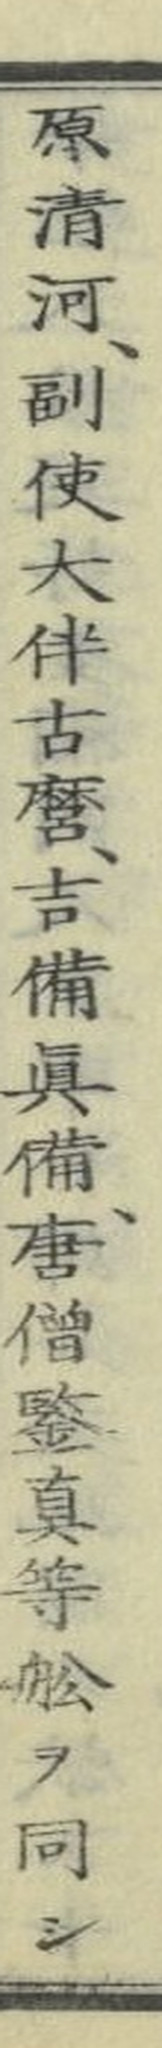原清河、副使大伴古麿、吉備真備、唐僧鍳真等舩ヲ同シ
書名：琉球藩史 一之巻
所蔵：University of the Ryukyus Library
